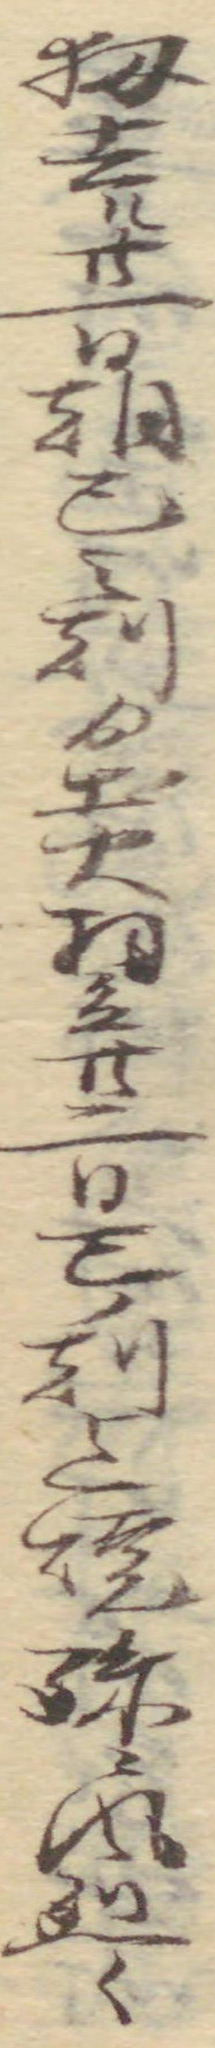扨去ル廿一日朝巳之刻ゟ出火翌廿ニ日巳ノ刻迄焼殊ニ風烈く
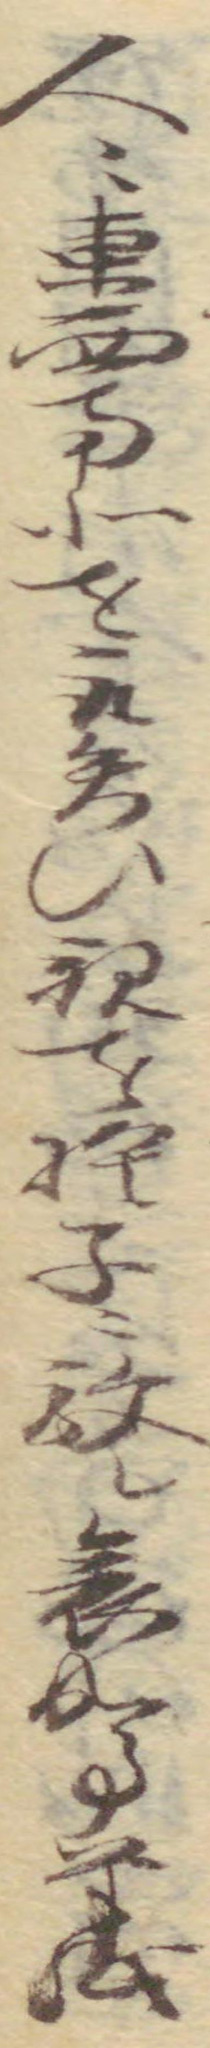人々東西南北を取失ひ親を捨子ニ放レ哀成事筆紙
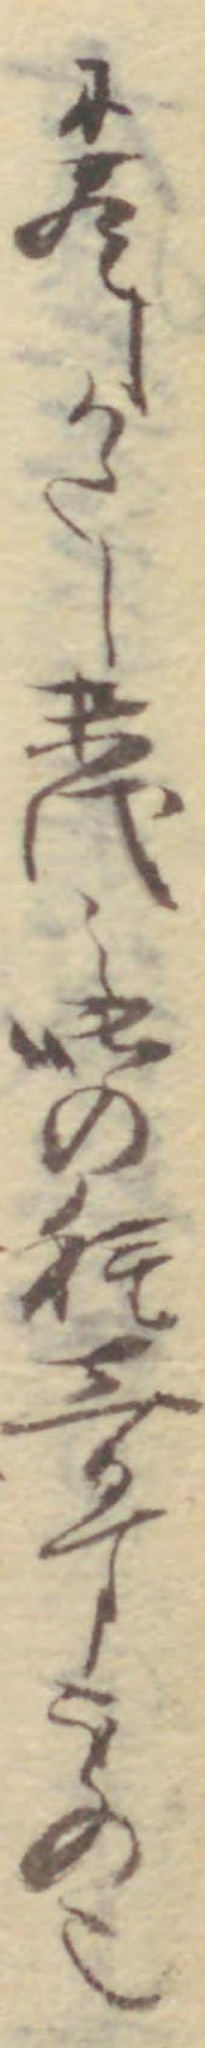に尽くしかたし末代之咄の種しるすもの也
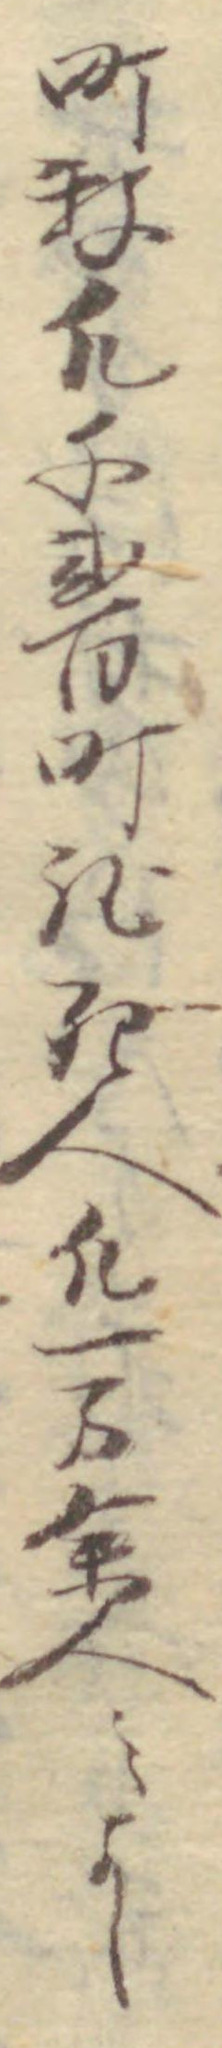町数凡千弐百町程死人凡一万余人之よし
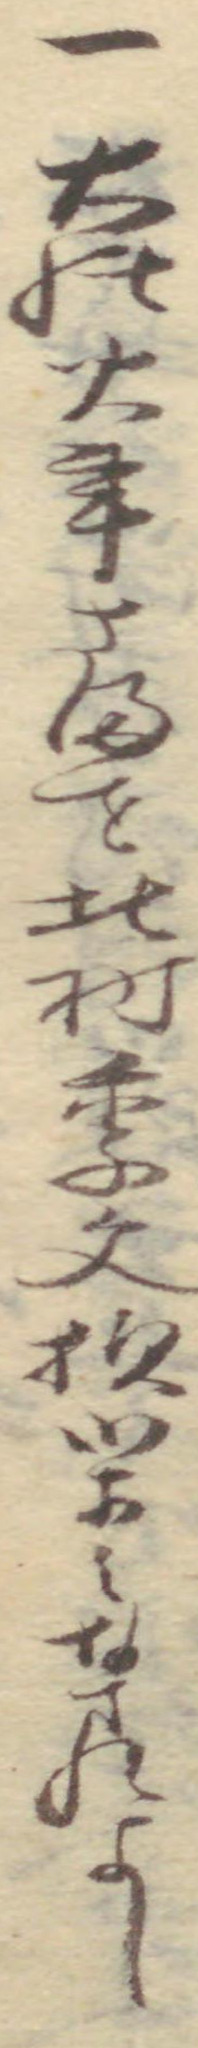一右の火事さまを北村季文様御よミなされ候よし
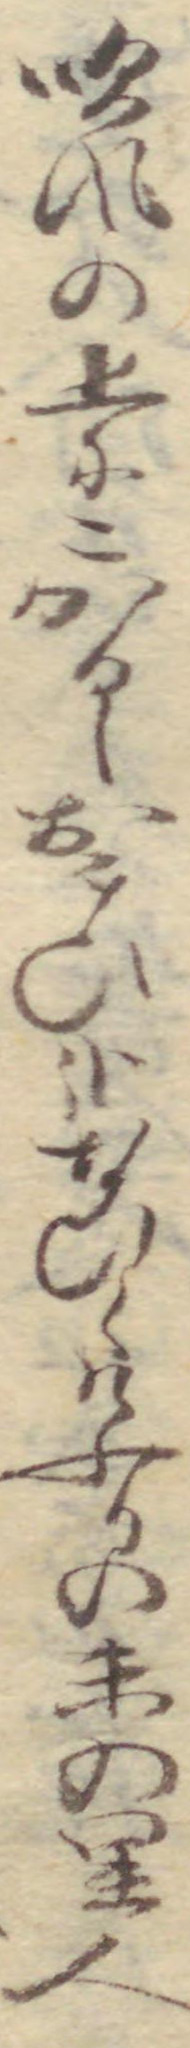吹風の上にこかるゝおもひやなひくけふりの末の里人
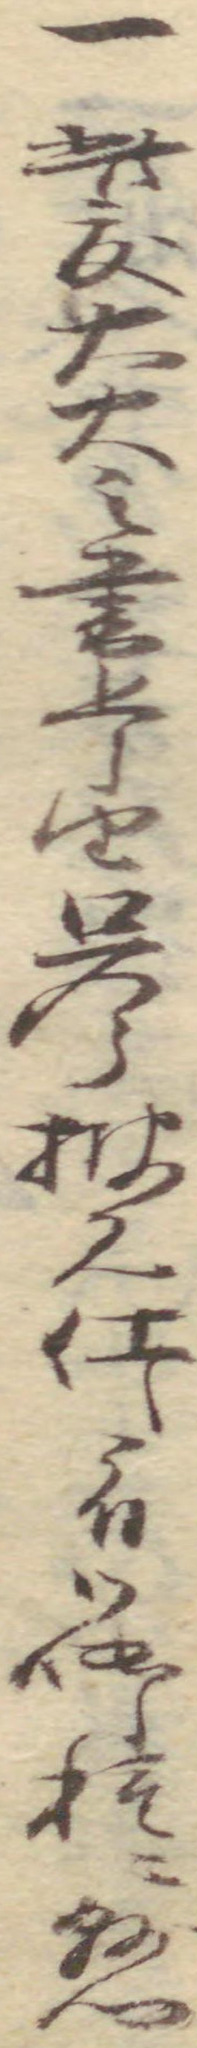一此度大火之書上候由只今披見仕候ニ付御咄之種ニ懸
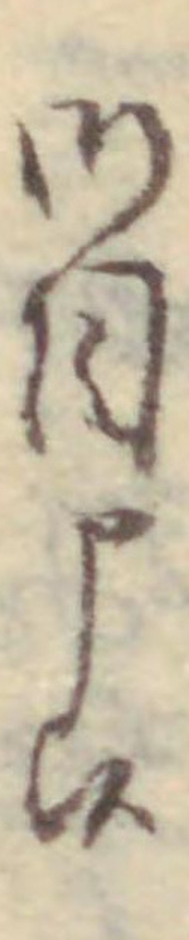御目申候
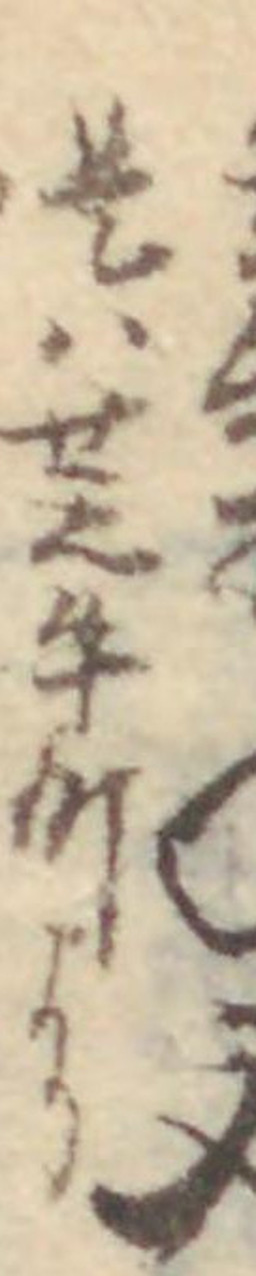是ハ芝牛町より
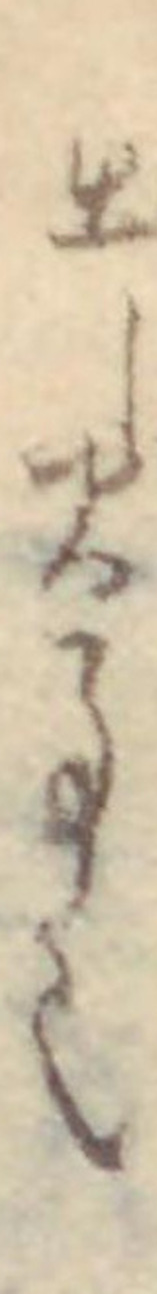出候火事也
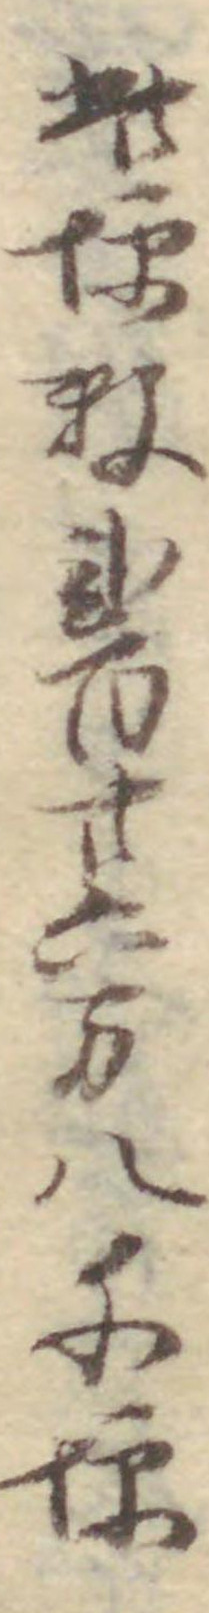此坪数弐百廿六万八千坪
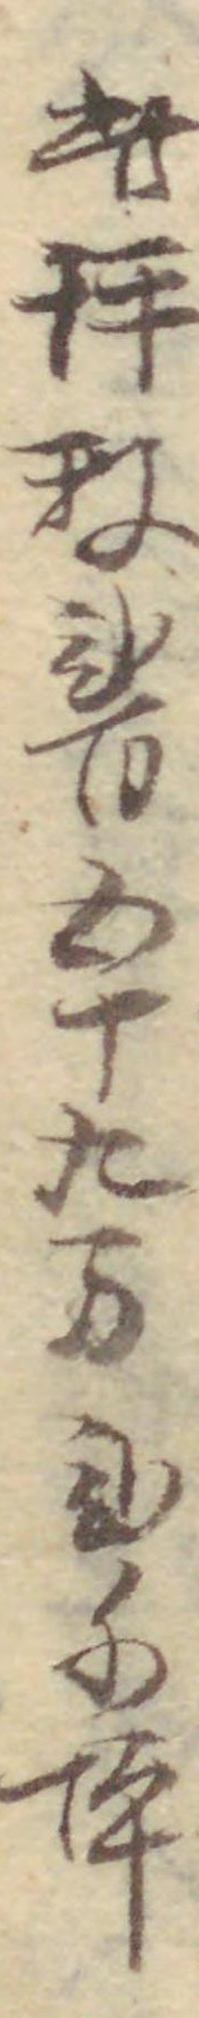此坪数弐百五十九万弐千坪
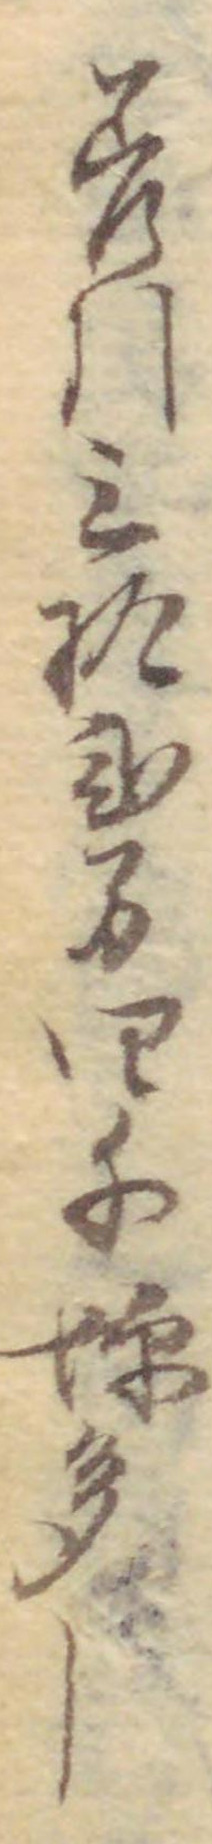差引三拾弐万四千坪多し

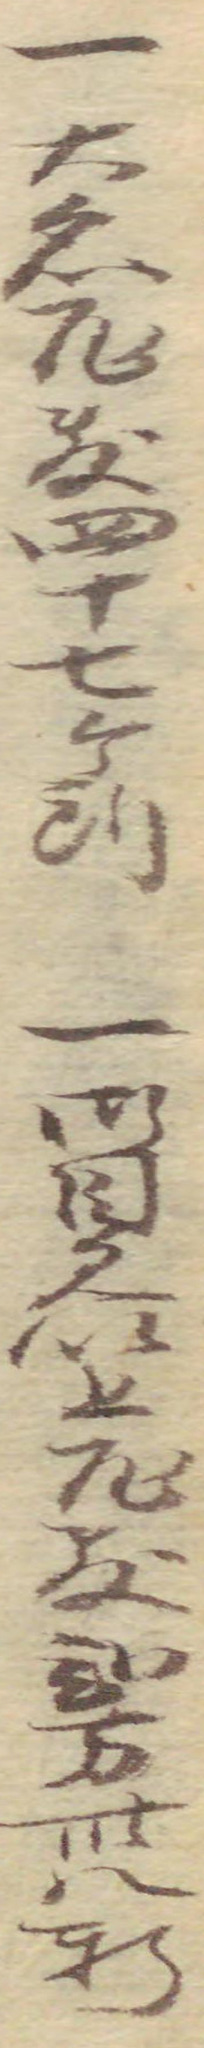一大名屋敷四十七ケ所一御目見以上屋敷弐万丗八軒
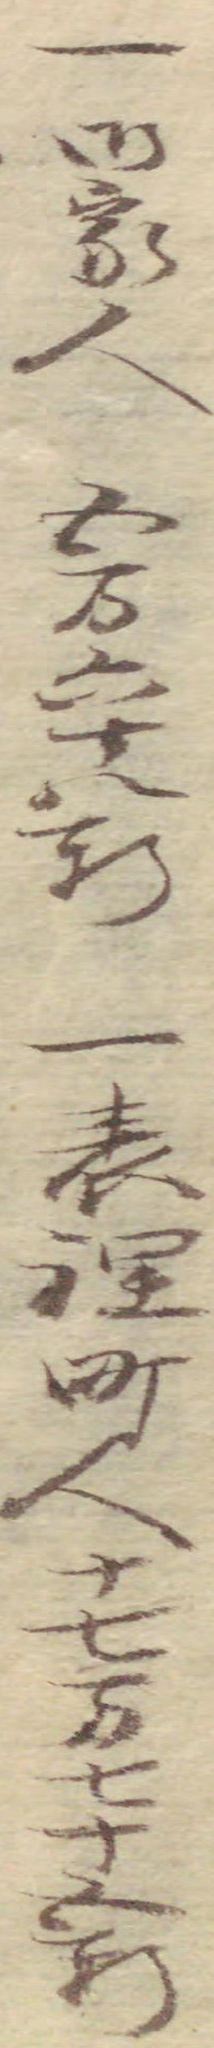一御家人五万六十八軒一表裡町人十七万七十五軒
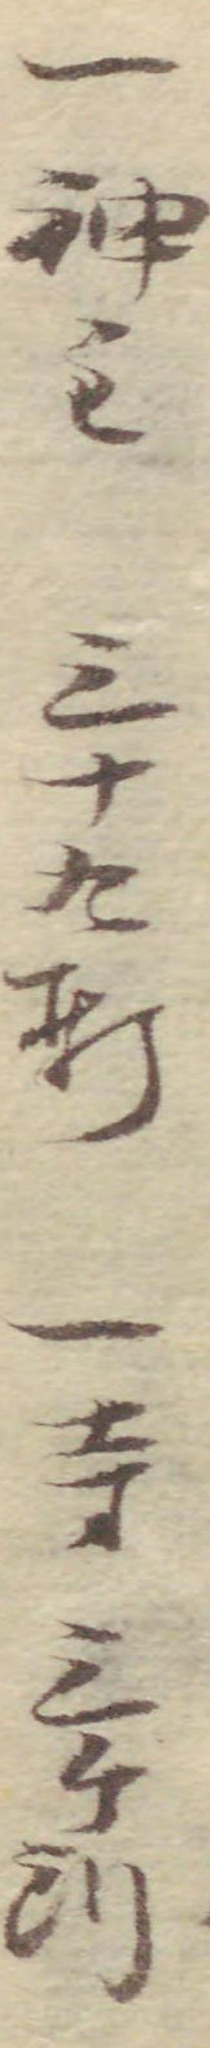一神主三十九軒一寺三ヶ所
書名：鶯宿雑記. 巻199-200
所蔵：国立国会図書館 National Diet Library, JAPAN
